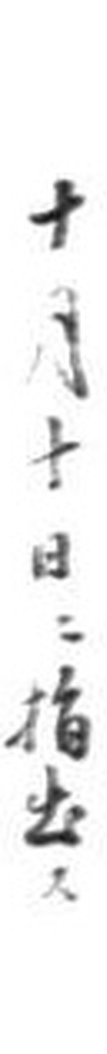十月十日ニ指出ス

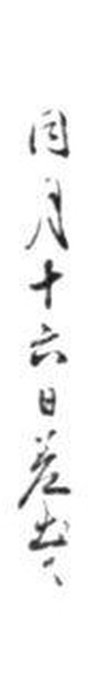同月十六日差出ス
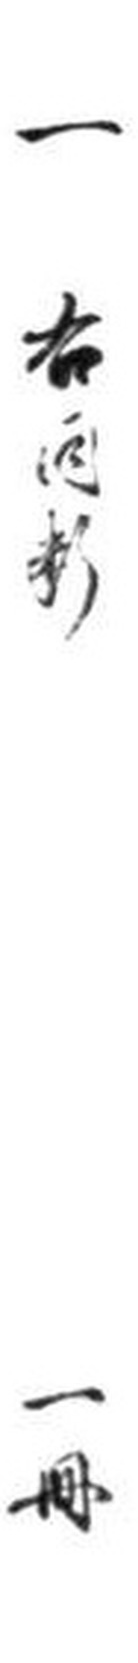一右同断一冊
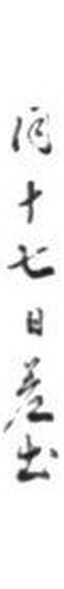同十七日差出
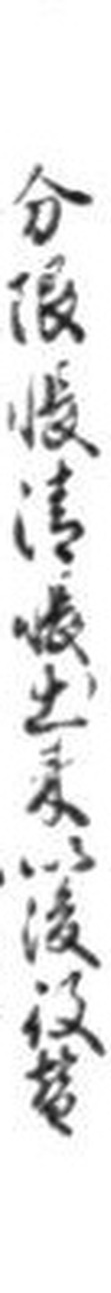一分限帳請帳出来以後役替
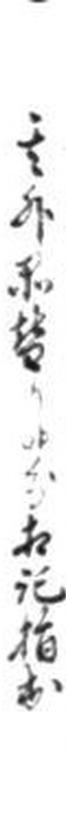其外品替り候分相記指出一冊
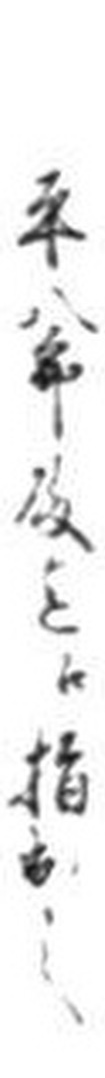平八郎殿迄被指出之
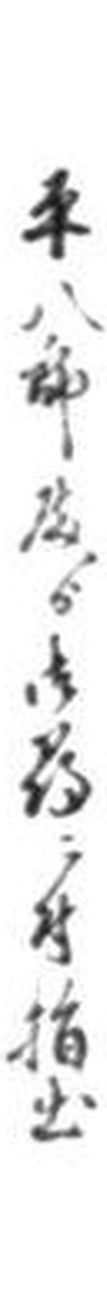平八郎殿ゟ御尋ニ付指出
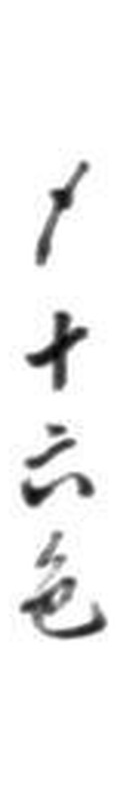〆十六色
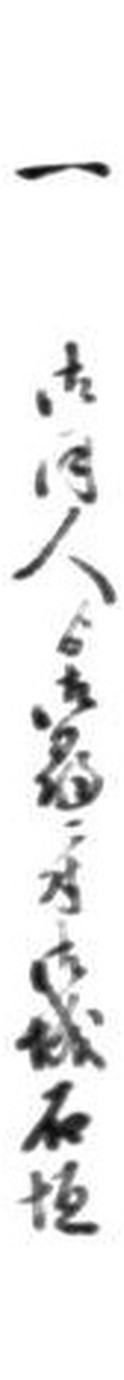一御同人ゟ御尋ニ付御城石垣
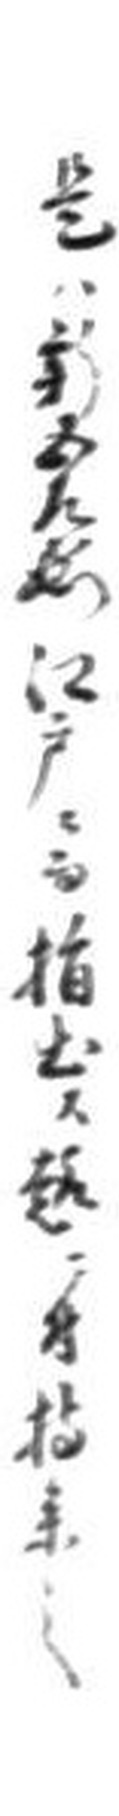是ハ新五左衛門江戸ニ而指出ス趣ニ付持参之
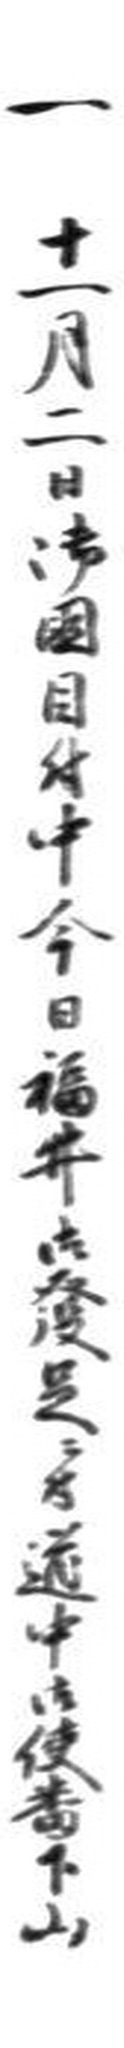一十一月二日御国目付中今日福井御発足ニ付道中御使番下山
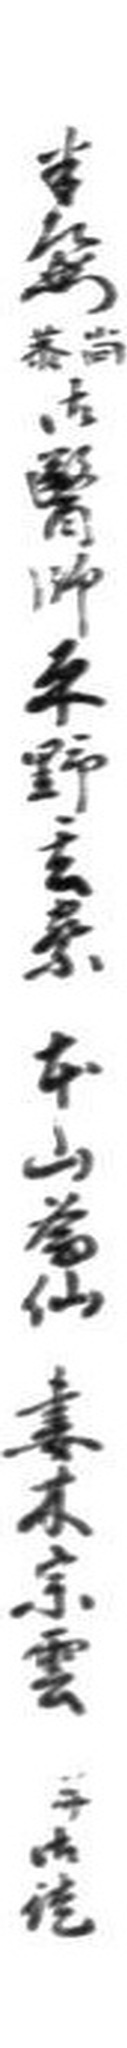半左衛門尚恭御医師平野玄察本山為仙妻木宗雲幷御徒

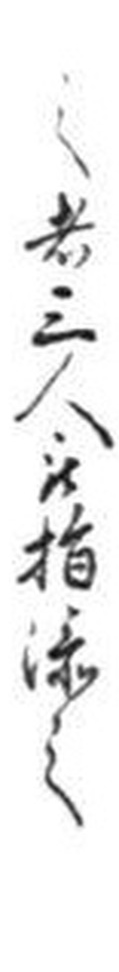之者三人被指添之
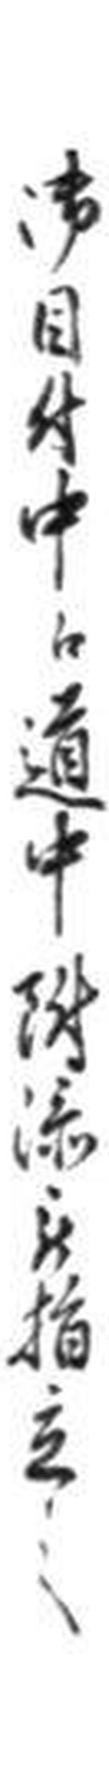御目付中江道中附添被指立之
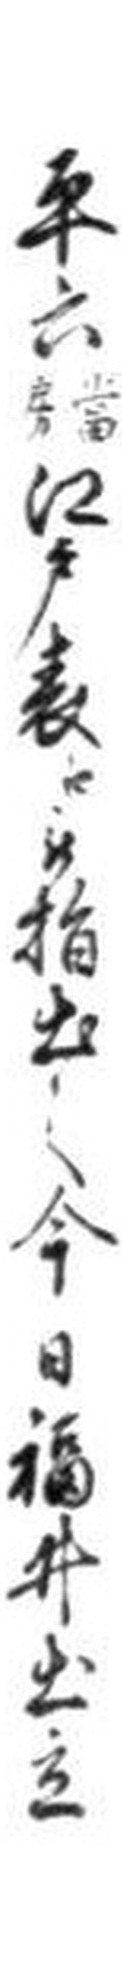平六当房江戸表江被指出之今日福井出立
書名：家譜 三十九 宗矩公 享保十年
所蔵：福井県文書館 Fukui Prefectural Archives
